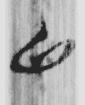㠯（以）
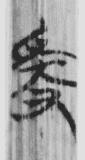{爯又}
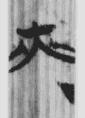火
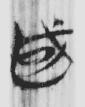或
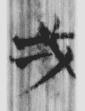{戈一}
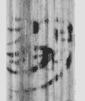旬
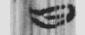日
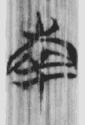南
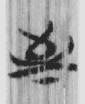至
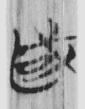或
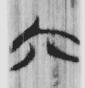六
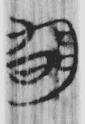旬
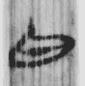白
